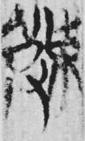○（世）
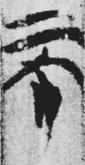不
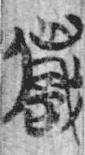○（識）
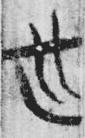必
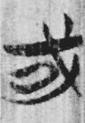或
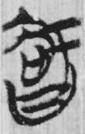智（知）
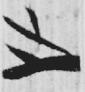之
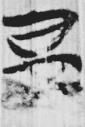是
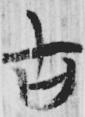古（故）
